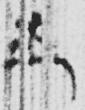之
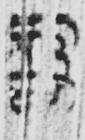舍（敘）
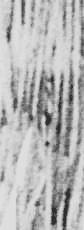鼎（則）
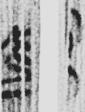宜
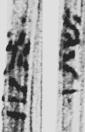道
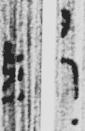也
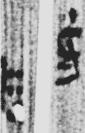或
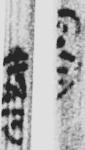舍（敘）
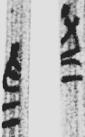爲
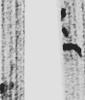之
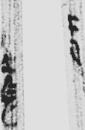節
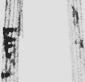鼎（則）
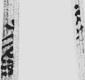○（文）
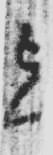也
